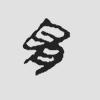胃
